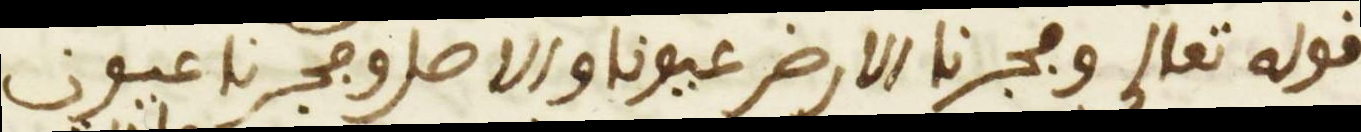قوله تعالى وفجرنا الارض عيونا والاصل وفجرنا عيون
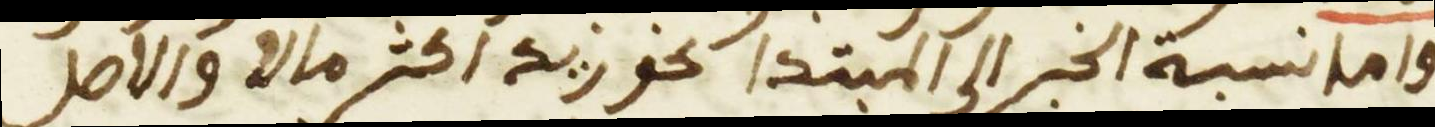واما نسبة الخبر الى المبتدا نحو زيد اكثر مالا والاصل
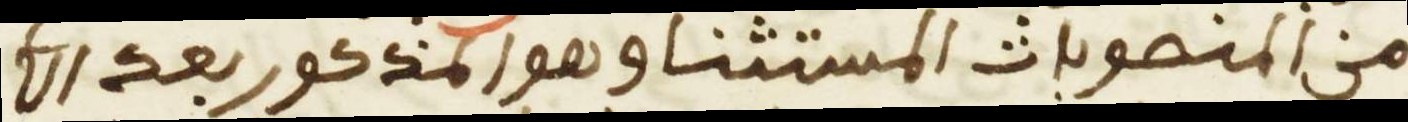من المنصوبات المستثنا و هو المذكور بعد الا
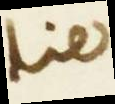هنا
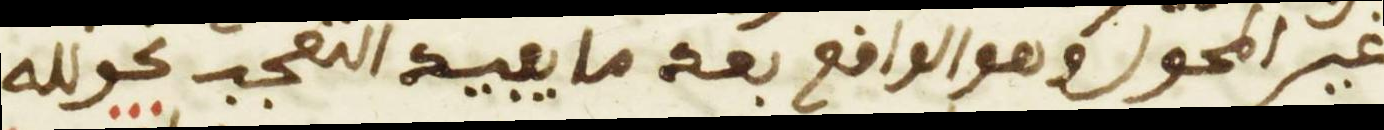غير المحول وهو الواقع بعد ما يفيد التعجب نحو لله
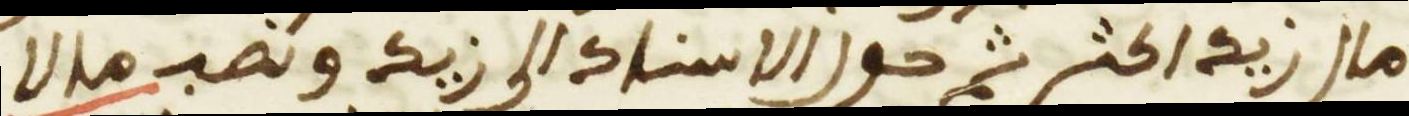مال زيد اكثر ثم حول الاسناد الى زيد ونصب مالا
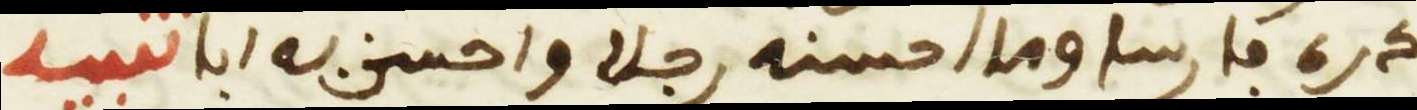دره فارسا وما احسنه رجلا واحسن به ابا تنبيه
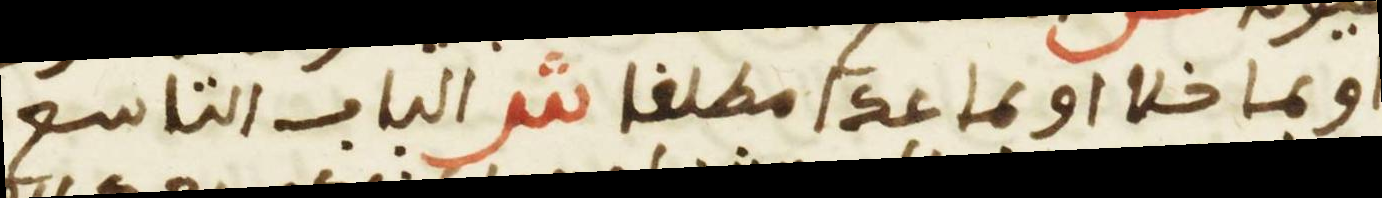او بما خلا او بما عدا مطلقا ش الباب التاسع
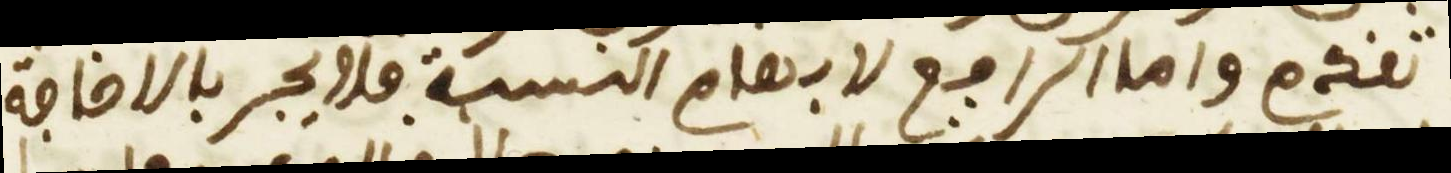تقدم و اما الرافع لابهام النسبة فلا يجر بالاضافة
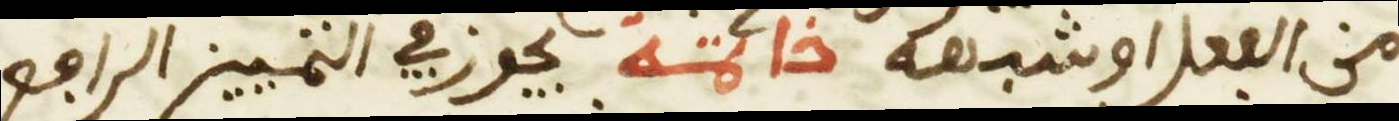من الفعل او شبهه خاتمة يجوز في التمييز الرافع
